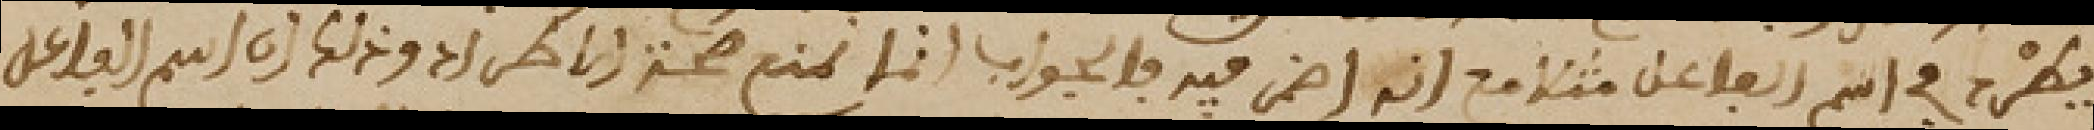يطرح في اسم الفاعل مثلا مع انه اضمر فيه بالجواب انما تمنع صحة الاطراد و ذلك ان اسم الفاعل
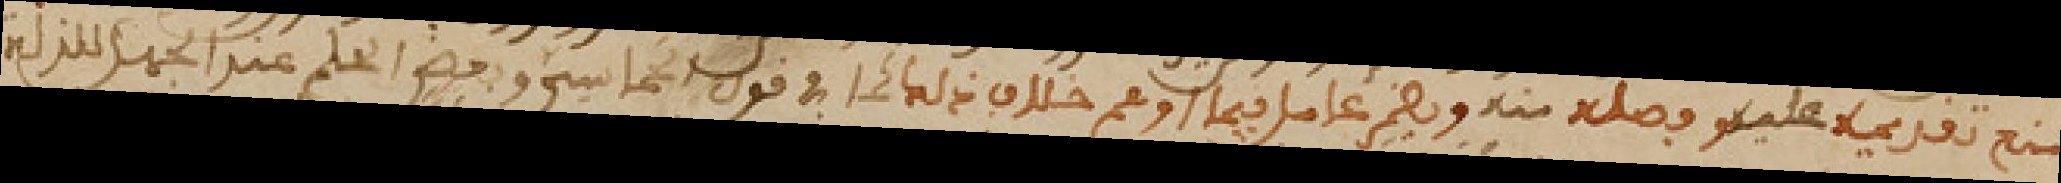منع تقديم عليه بصلة منه و يضمن عامل فيها او هم خلاف ذلك كما في قول الخماسين و بعض الحلم عند الجهل للذله
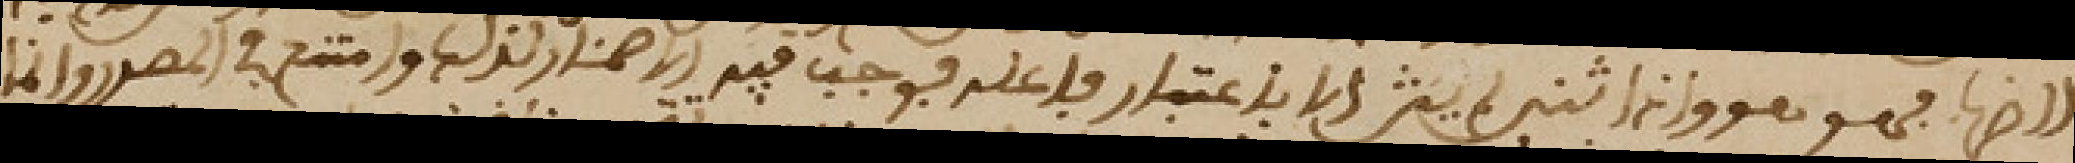الضرب فهو هو و اذا و اثنين لم يتن الا باعتبار فاعله بوجوبفيه الاضمار لذلك وامتنع في المصدرو انما
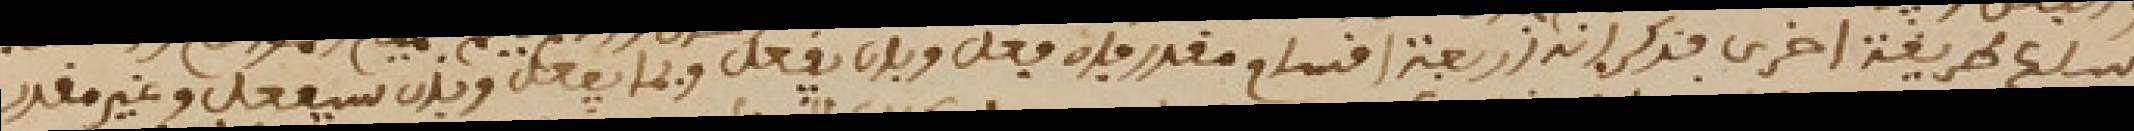سلك طريقة اخرى فذكر انه اربعة افسام مقرر فان فعل وبان يفعل وبما يفعل وبه سيفعل و غير مقرر
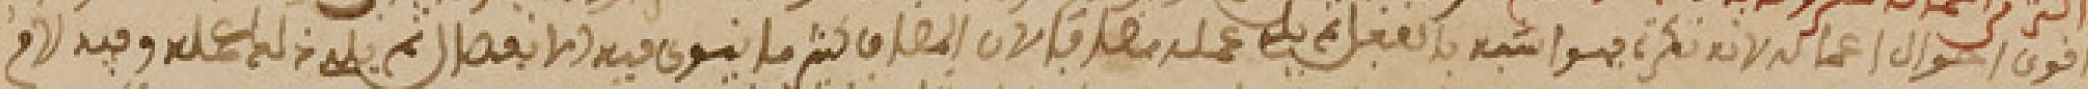اقوى احوال اعماله لانه نكرة بهذا اشبه بالفعل ثم يلي عملهبضافا الان المضاف كثير ما ينوى فيه الافصال ثم يلي ذلك عمله و فيه لام
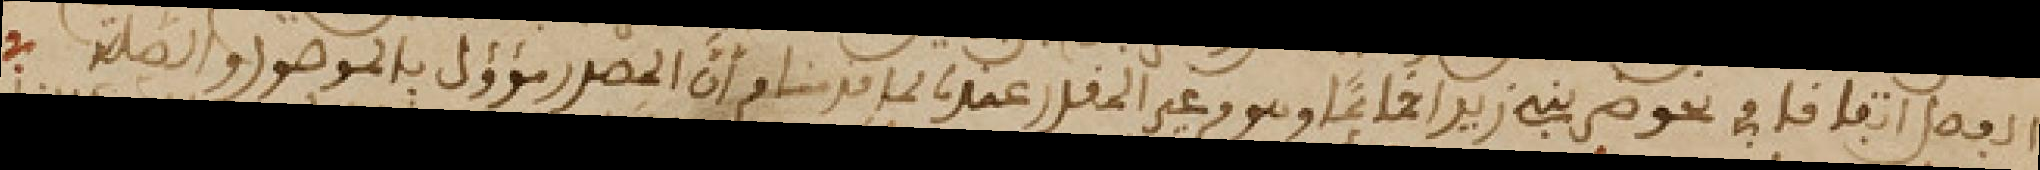الفصل اتفاقا في نحو ضربني زيراخماتما و هو من غير المقرر عنده لما قدمنا من أن المصدر مؤول بالموصول و الصلة
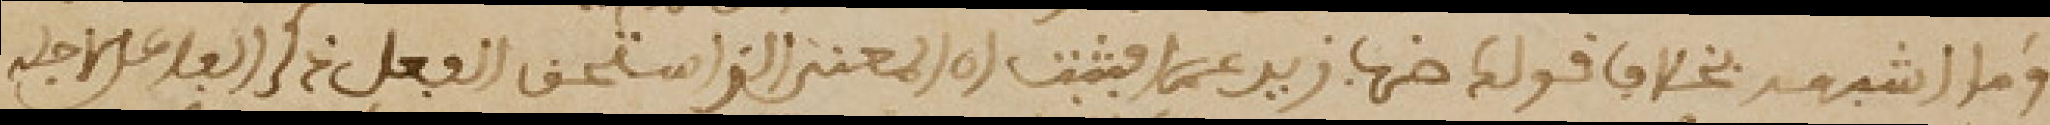وما اشبهه بخلاف قولك ضرب زيد عمرا فثبت ان المعنى الذي استحق الفعل ذكرا البلاغة لاجله
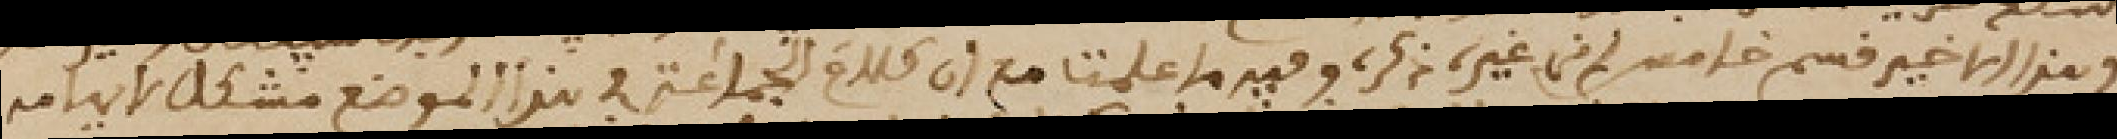وهذا الاخير قسم خامس لم قر غيره ذكره وفيه ما علمت مع ان كلام الجماعة في هذا الموضع مشكل لا يمهامه
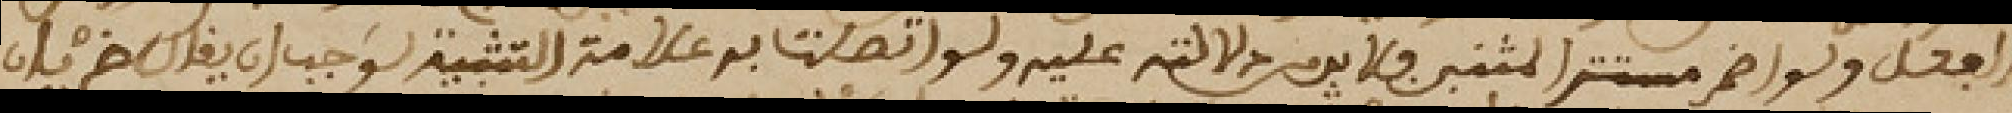الفعل ولو اضمر مستترا المثنى و لا يرمز دلالته عليه و لو اتصلت به علامة التشبيه لوجب ان يقال ضربان
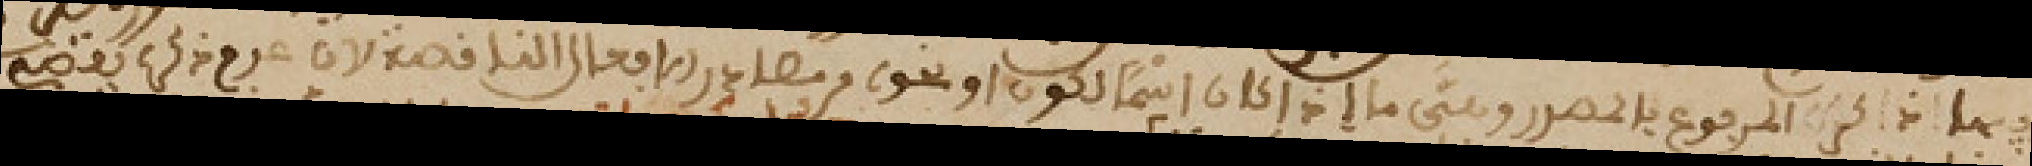و بها اذ اكره المرجوع بالمصدر و هي ما اذ اكان اسما لكون او نحوى من مصادر الافعال الناقصة لان عدم ذكره يفضى
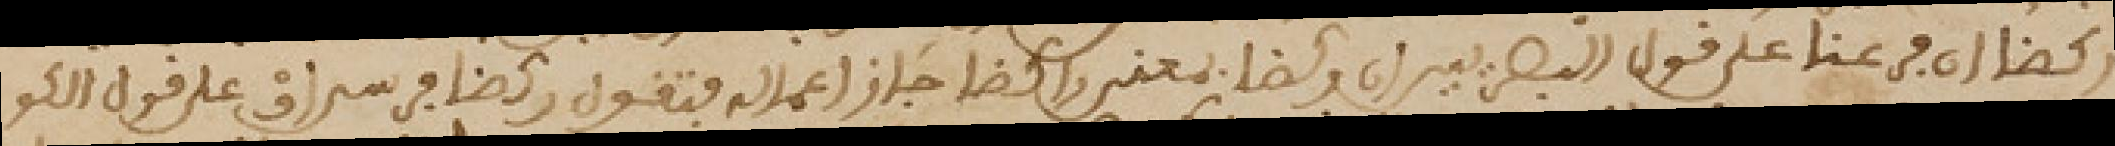ركضا ان فرعنا على قول البصريين ركضا بمعنى راكضا جاز اعماله فتقول ركضا في سراق على قول الكم
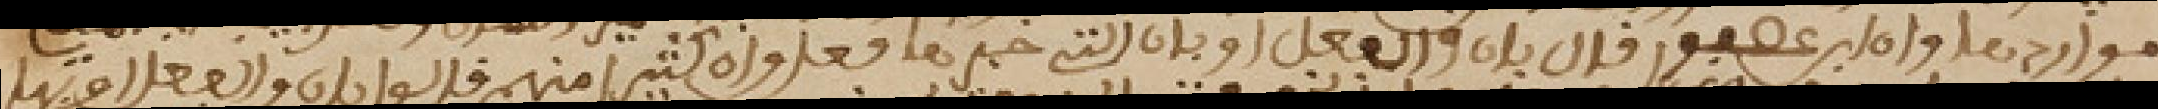مواردها وان ابن عصفور قال بان الفعل او بان التي خبرها فعل وان كثيرا منهم قالوا بان والفعل او بها
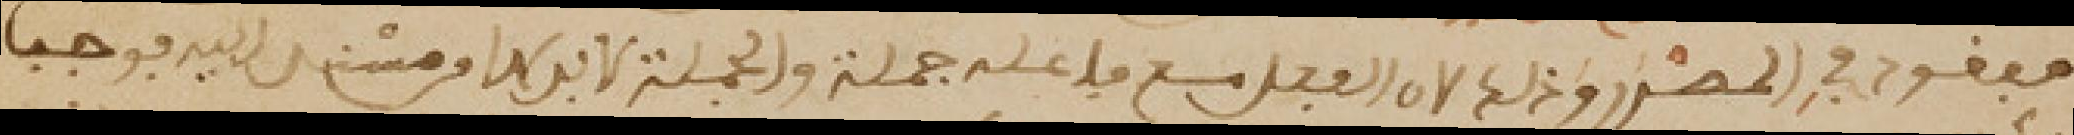مبقور في المصدر وذلك لان الفعل مع فاعله جملو و الجملة لا بد لها من مسند اليه بوجب
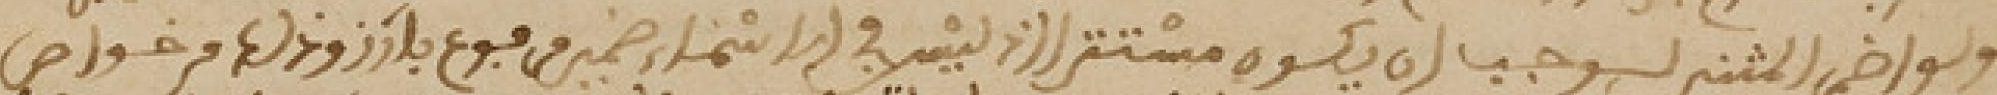و لو اضمر المثنى لوجب ان يكون مستترا اذ ليست الاسماء ضمير مرجوع بلكن و ذلك مدخول في
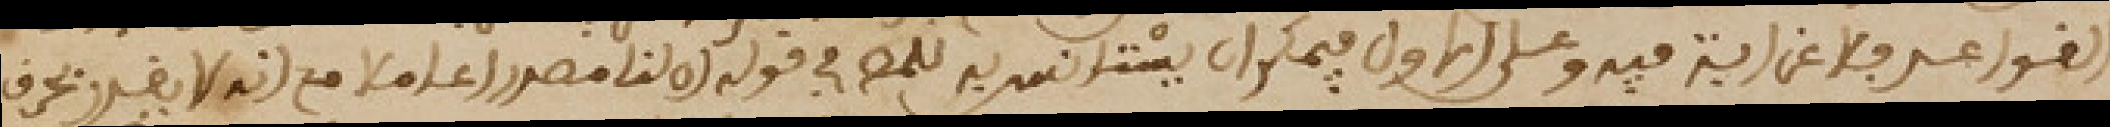القول عد فلا غرابة فيه وعلى الاول يمكن ان يستانس به سمع في قوله اي لنا مصر عاملا مع انه لا يقرر بحرف
